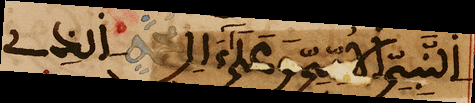النبي الامي و على ءال محمد الذي
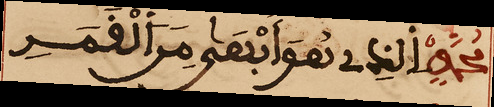محمد الذي هو أبهر من القمر
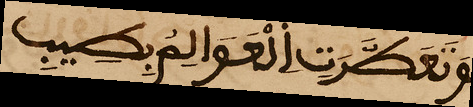و تعطرت العوالم بطيب
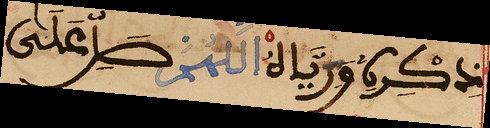ذكره و رياه اللهم صل على
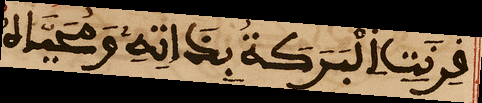قرنت البركة بذاته و محياه
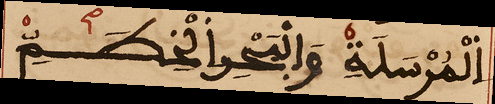المرسلة و و البحر الخطم
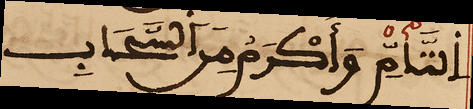التام و أكرم من السحاب
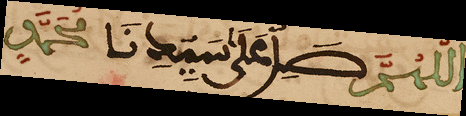اللهم صل على سيدنا محمد
